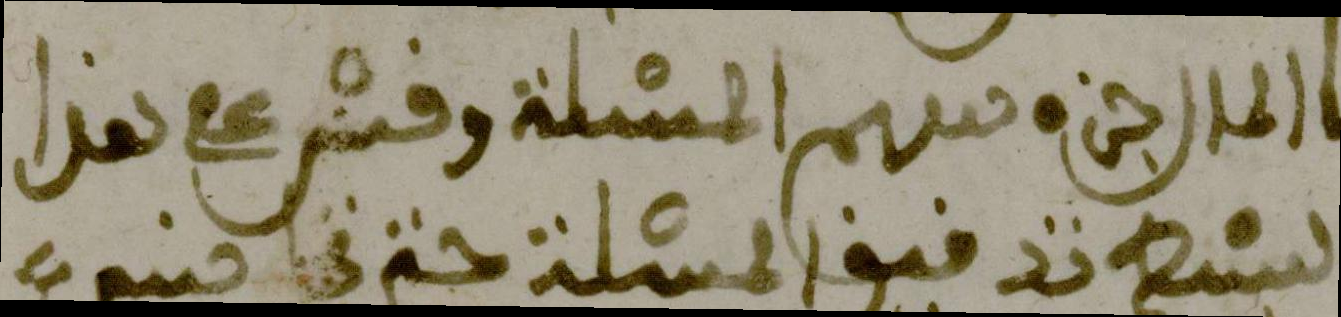المال جزء سهم المسْلة وقسْ على هذا
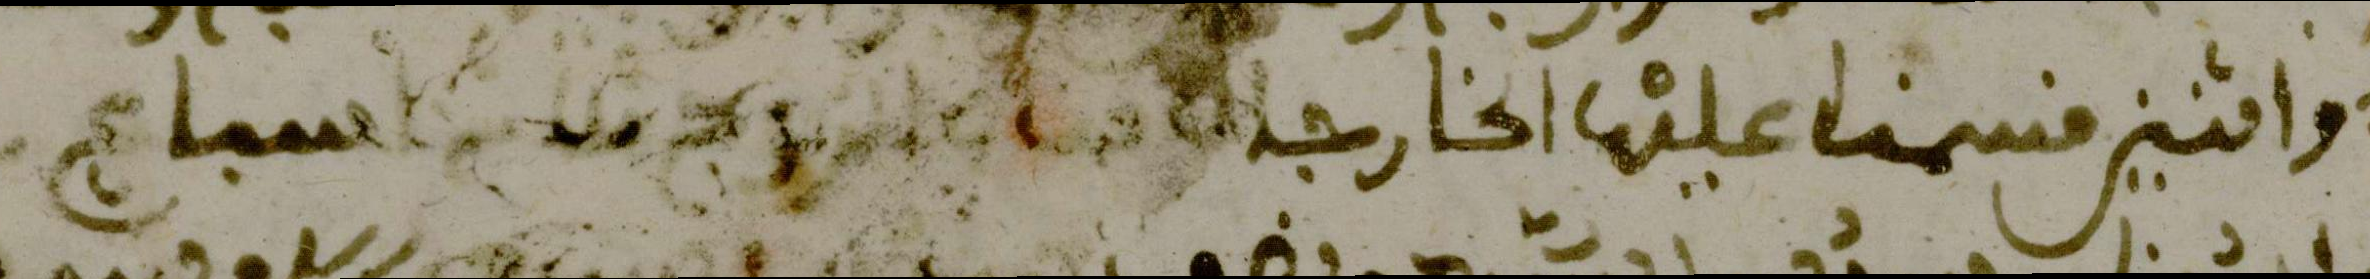واثنين قسمنا عليْها الخارجات ### اسباع
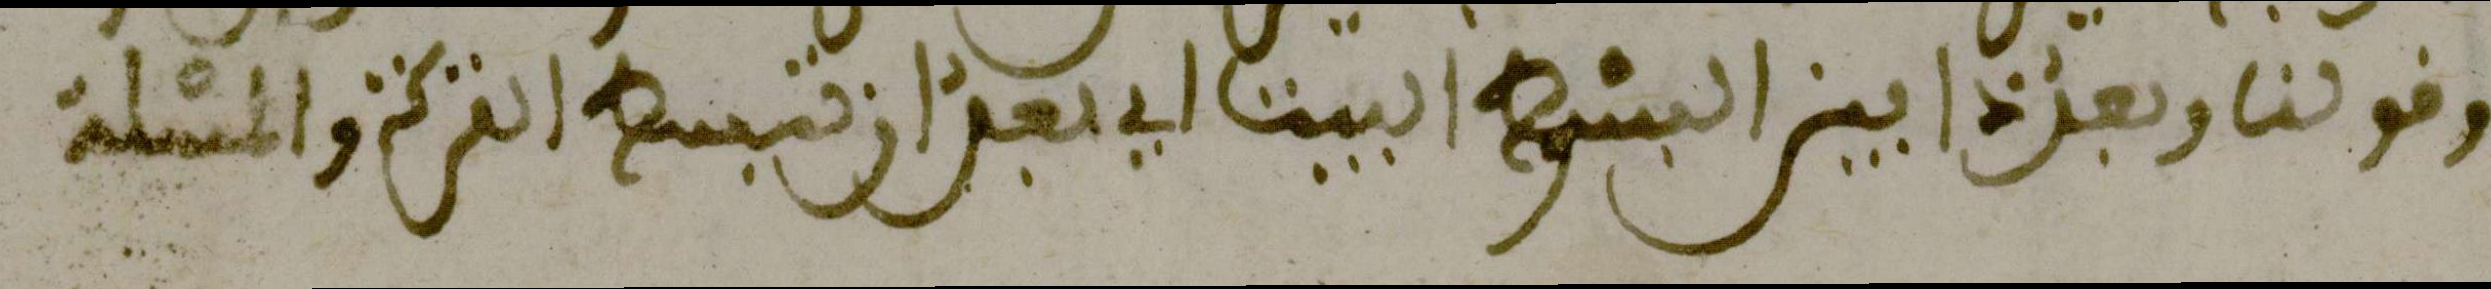وقولنا وبعدد ذابين البسوط البيت اي بعد ان تبسط التركة والمسْلة
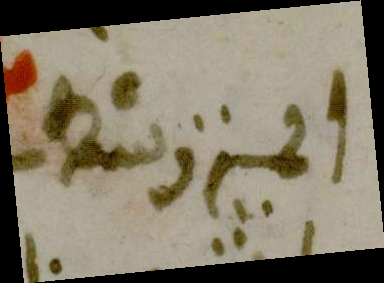ايمة وبسْط
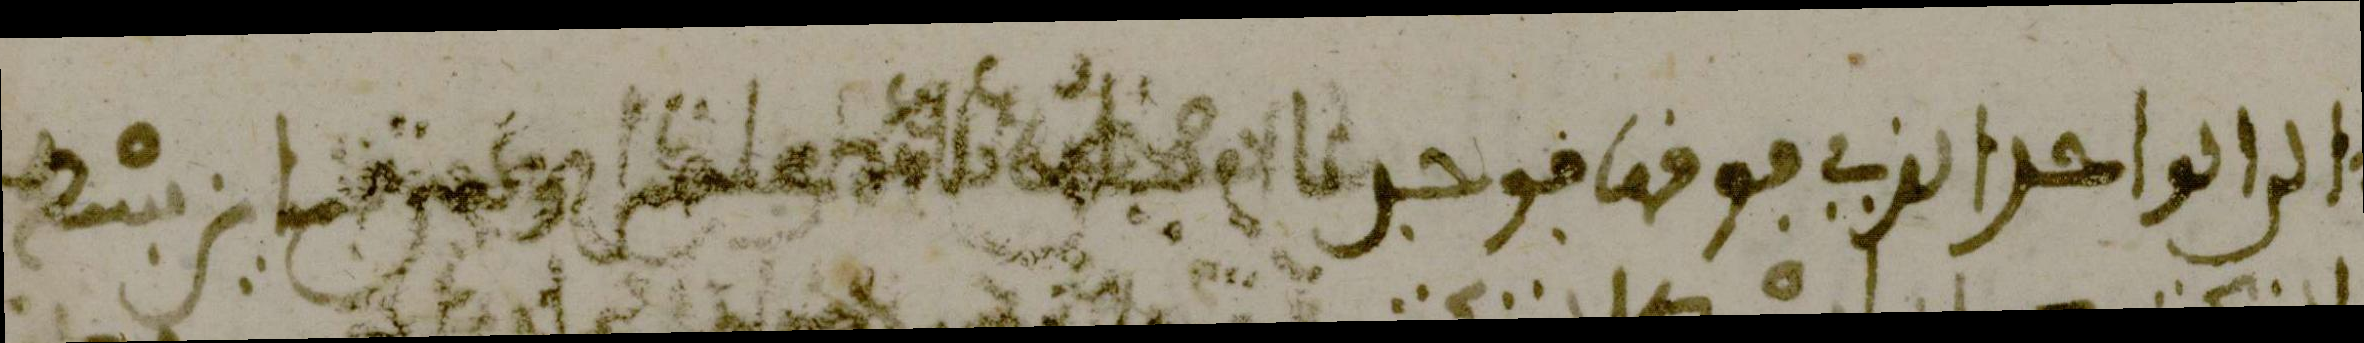الى الواجد الذي فوقها فوجدنا بسطها ثلاثة وهي تباين بسْط
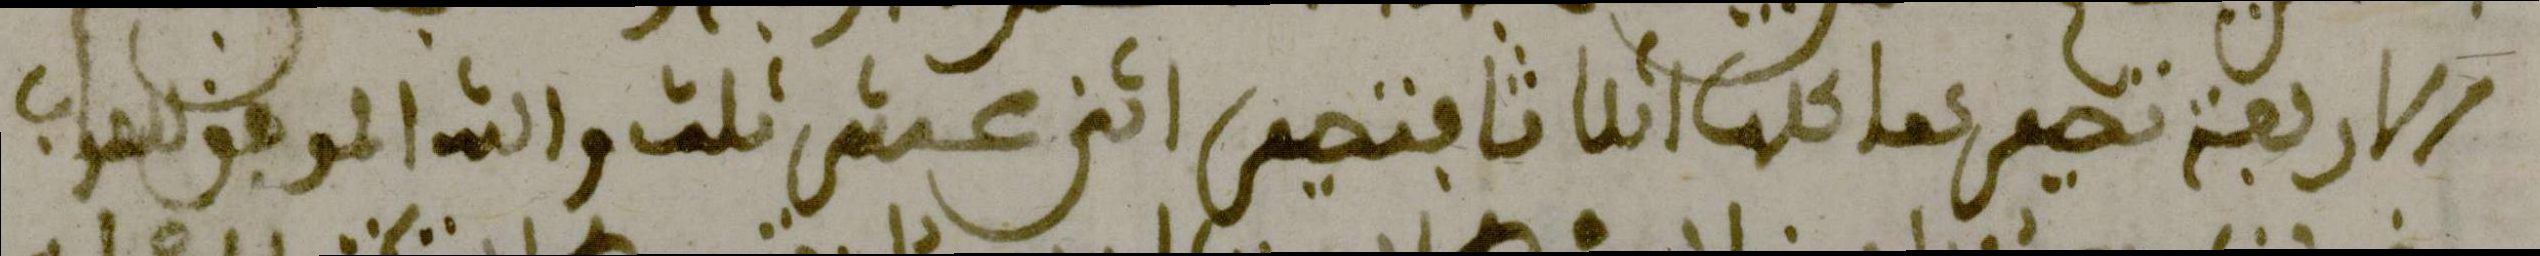الاربعة تصيرها كلها اثلاثا فتصيرا اثنى عشر ثلث والله الموفق للصواب
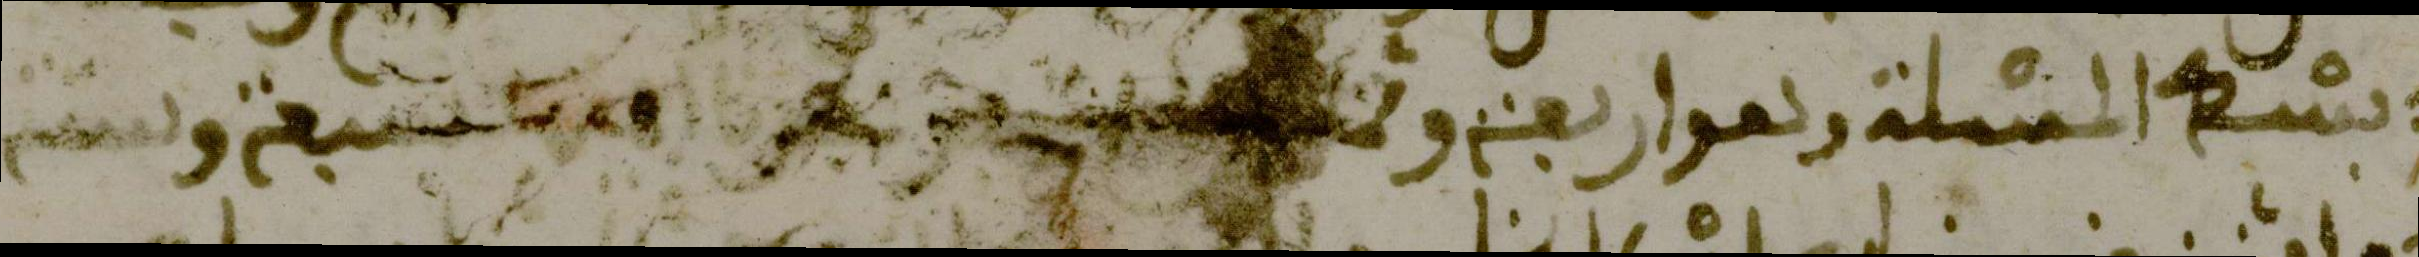بْسط المسْلة وهو اربعة وثما ### سبعة وستة
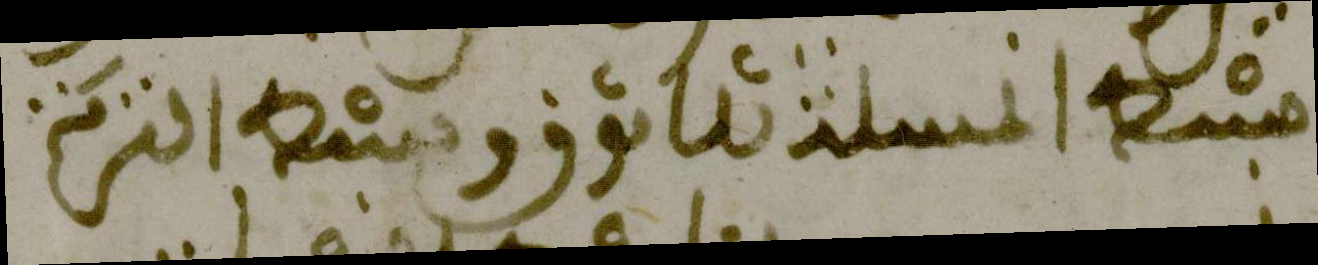بسْط المسلة ثلاثون وبسْط الترك
